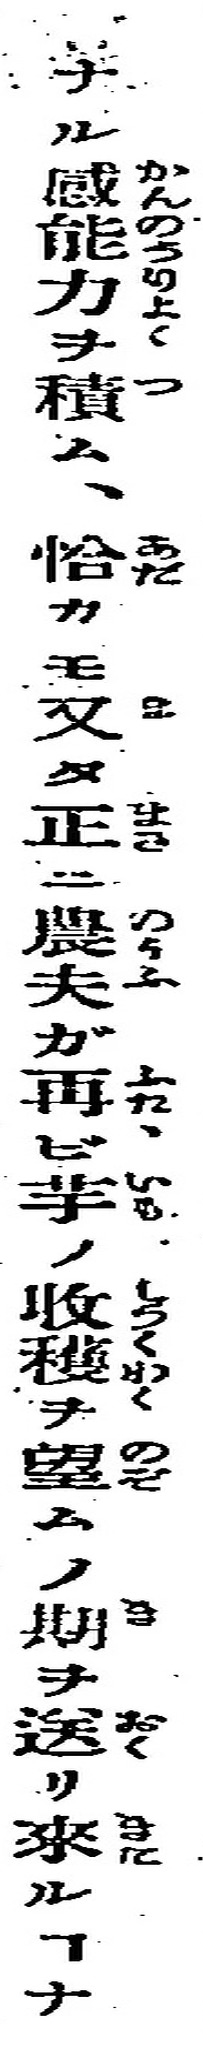ナル感能力ヲ積ム、恰カモ又タ正ニ農夫ガ再ビ芋ノ収穫ヲ望ムノ期ヲ送リ来ルヿナ
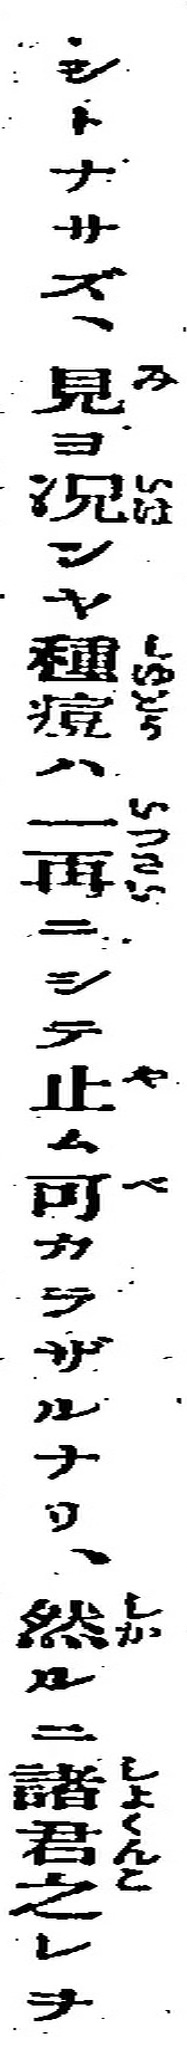シトナサズ、見よ况ンヤ種痘ハ一再ニシテ止ム可カラザルナリ、然ルニ諸君之レヲ

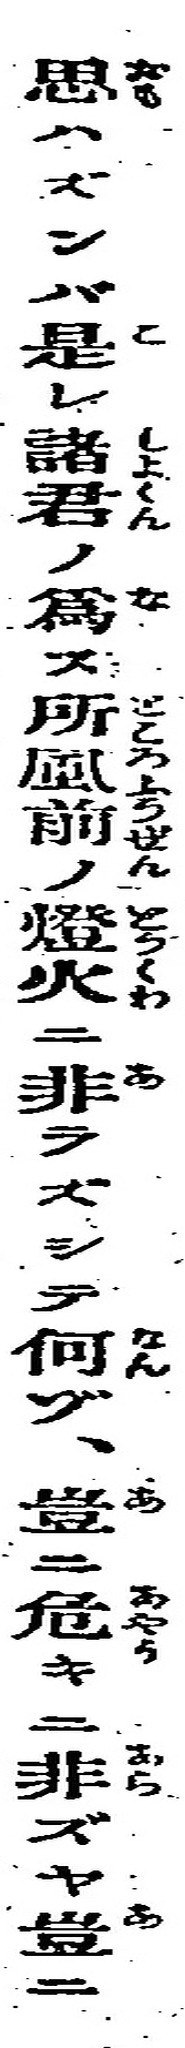思ハズンバ是レ諸君ノ為ス所風前ノ灯火ニ非ラズシテ何ゾ、豈ニ危キニ非ズヤ豈ニ
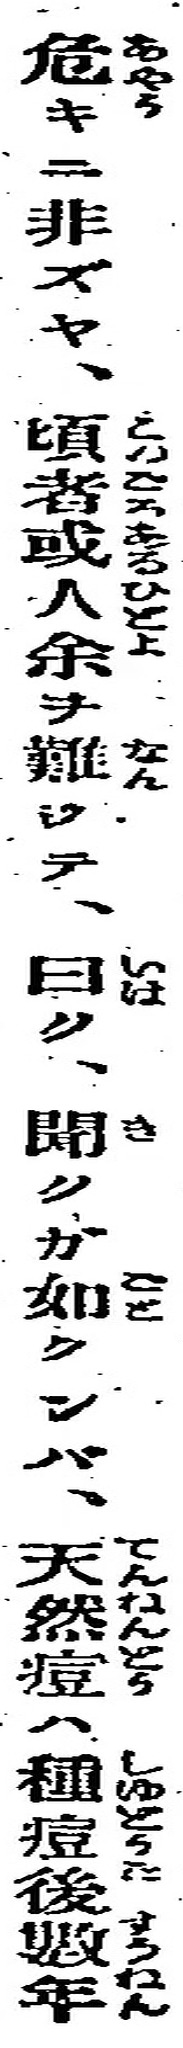危キニ非ズヤ、頃者或人余ヲ難ジテ、曰ク、聞クガ如クンバ、天然痘ハ種痘後数年
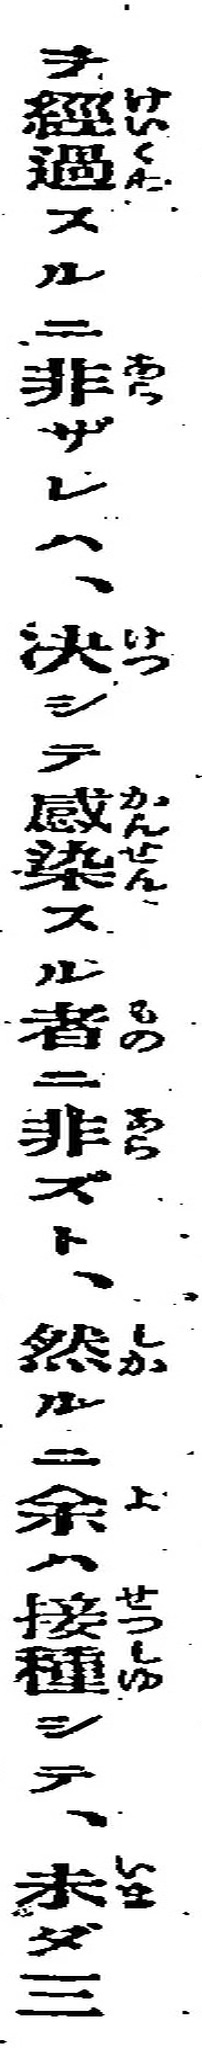ヲ経過スルニ非ザレハ、決シテ感染スル者ニ非ズト、然ルニ余ハ接種シテ、未ダ三
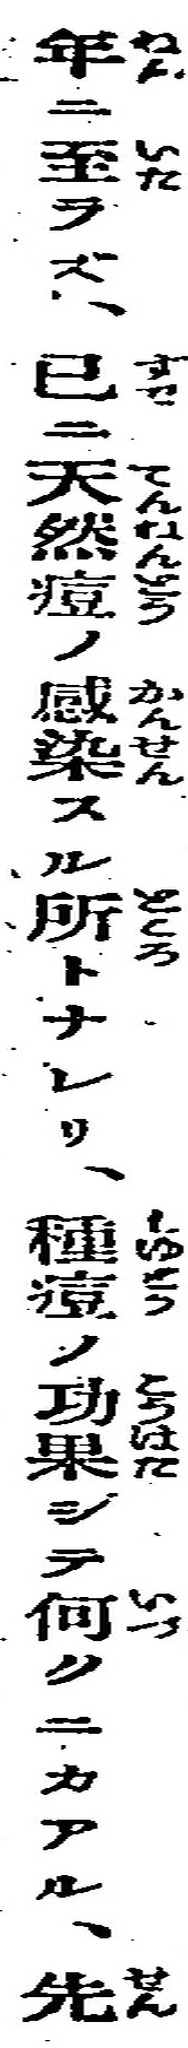年ニ至ラズ、已ニ天然痘ノ感染スル所トナレリ、種痘ノ功果シテ何クニカアル、先
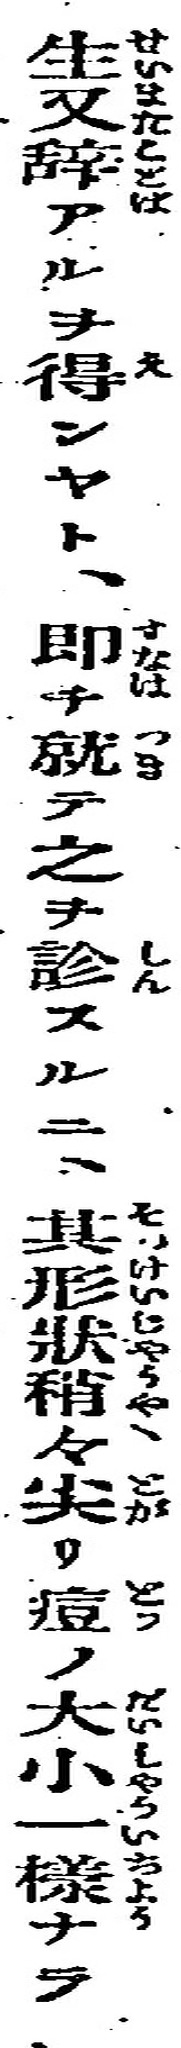生又辞アルヲ得ンヤト、即チ就テ之ヲ診スルニ、其形状稍々尖リ痘ノ大小一様ナラ
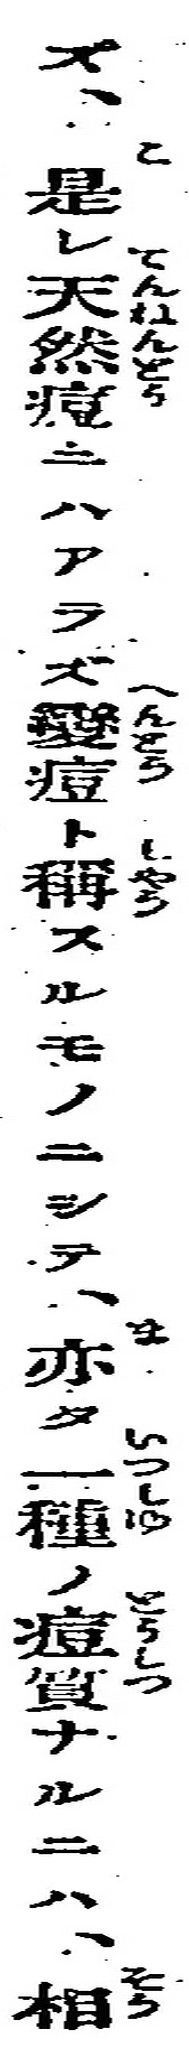ズ、是レ天然痘ニハアラズ変痘ト称スルモノニシテ、亦タ一種ノ痘質ナルニハ、相
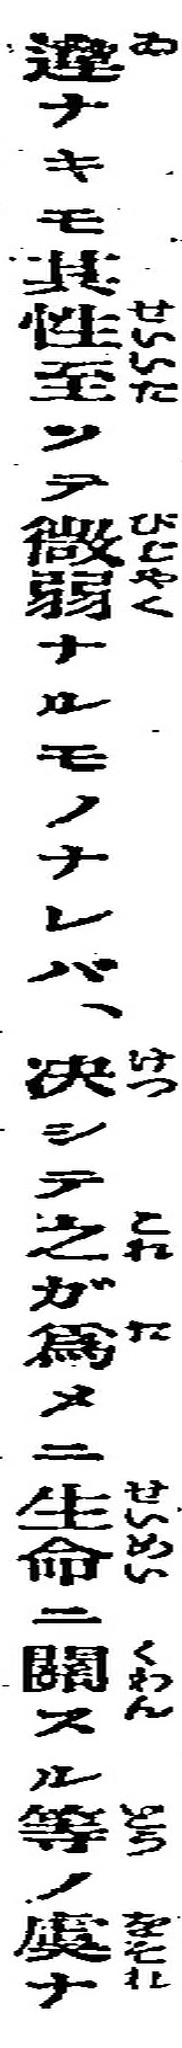違ナキモ其性至ツテ微弱ナルモノナレバ、決シテ之ガ為メニ生命ニ関スル等ノ虞ナ
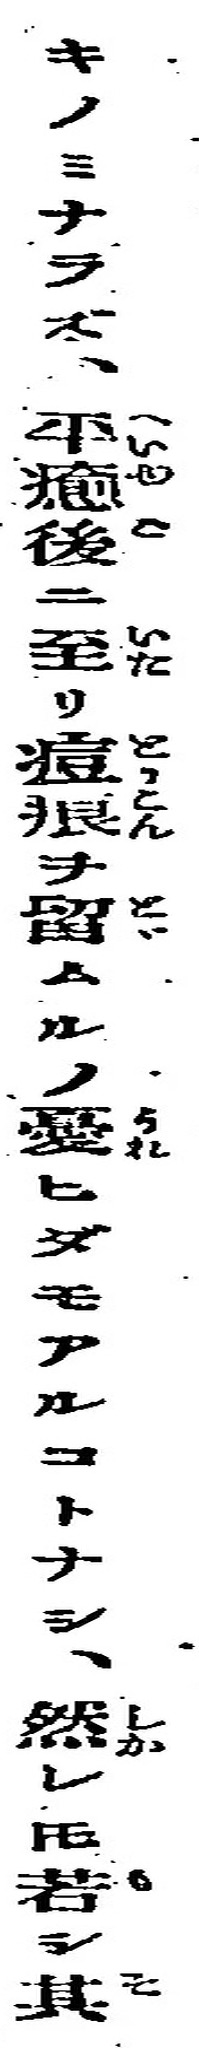キノミナラズ、平癒後ニ至リ痘痕ヲ留ムルノ憂ヒダモアルコトナシ、然レ𪜈若シ其
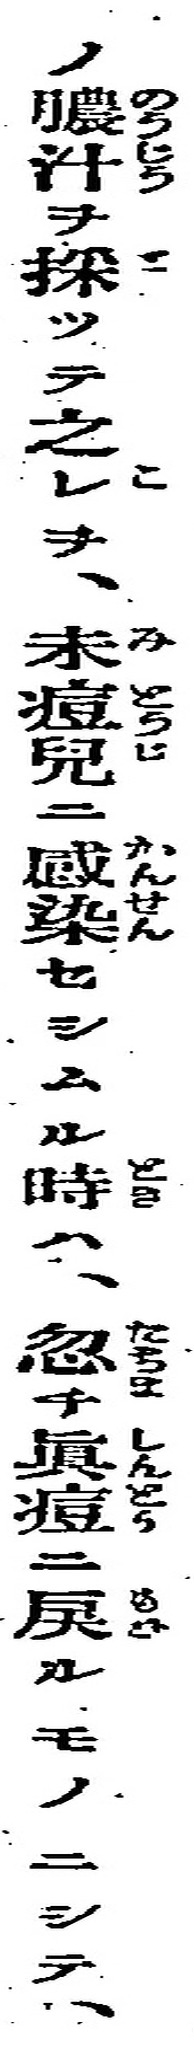ノ膿汁ヲ採ツテ之レヲ、未痘児ニ感染セシムル時ハ、忽チ真痘ニ戻ルモノニシテ、
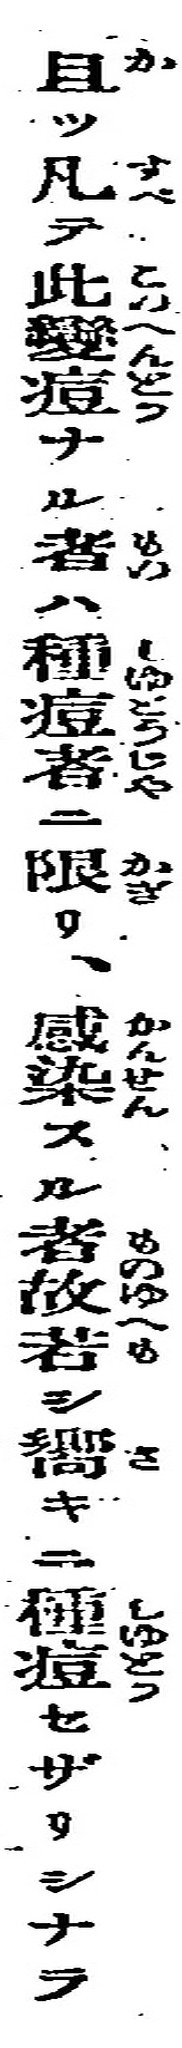且ツ凡テ此変痘ナル者ハ種痘者ニ限リ、感染スル者故若シ嚮キニ種痘セザリシナラ
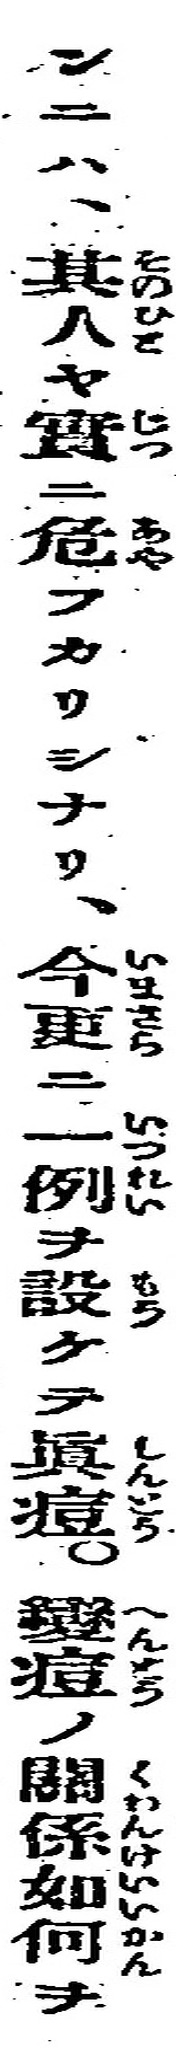ンニハ、其人ヤ実ニ危フカリシナリ、今更ニ一例ヲ設ケテ真痘○変痘の関係如何ヲ
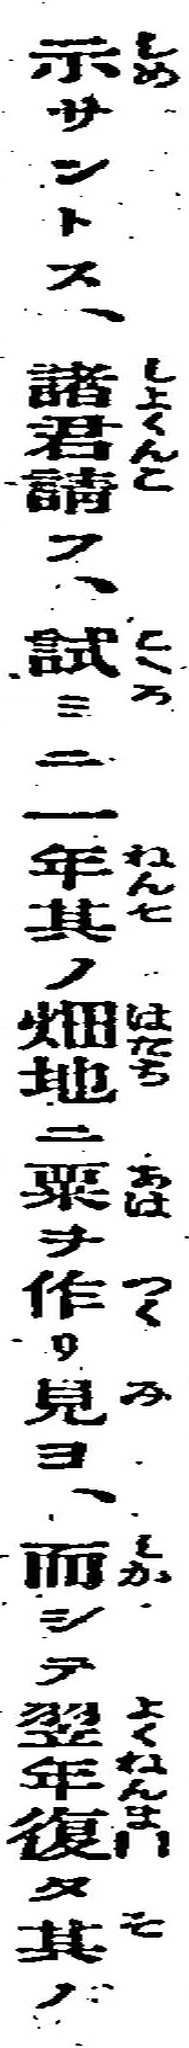示サントス、諸君請フ、試ミニ一年其ノ畑地ニ粟ヲ作リ見ヨ、而シテ翌年復タ其ノ
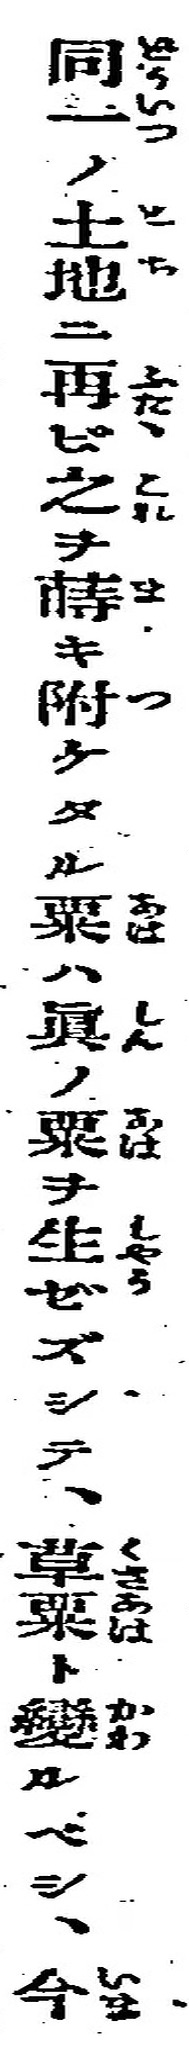同一ノ土地ニ再ビ之ヲ蒔キ附ケタル粟ハ真ノ粟ヲ生ゼズシテ、草粟ト変ルベシ、今
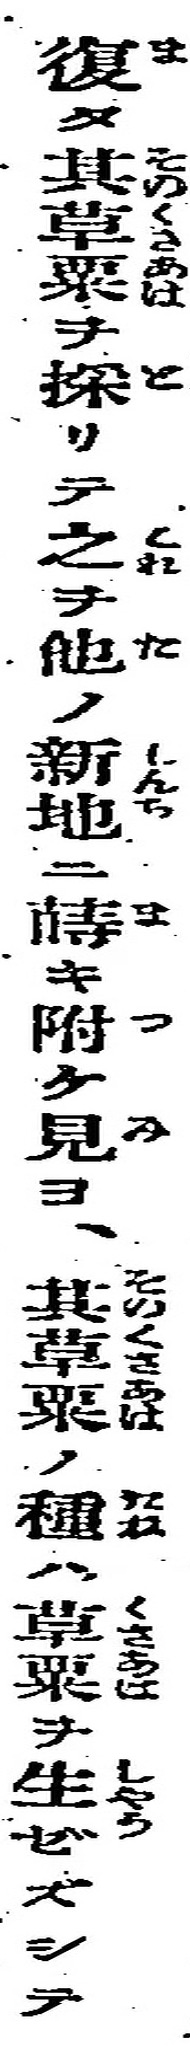復タ其草粟ヲ採リテ之ヲ他ノ新地ニ蒔キ附ケ見ヨ、其草粟ノ種ハ草粟ヲ生ゼズシテ
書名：天然痘予防注意兼種痘者之注意
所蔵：国立国会図書館 National Diet Library, JAPAN
